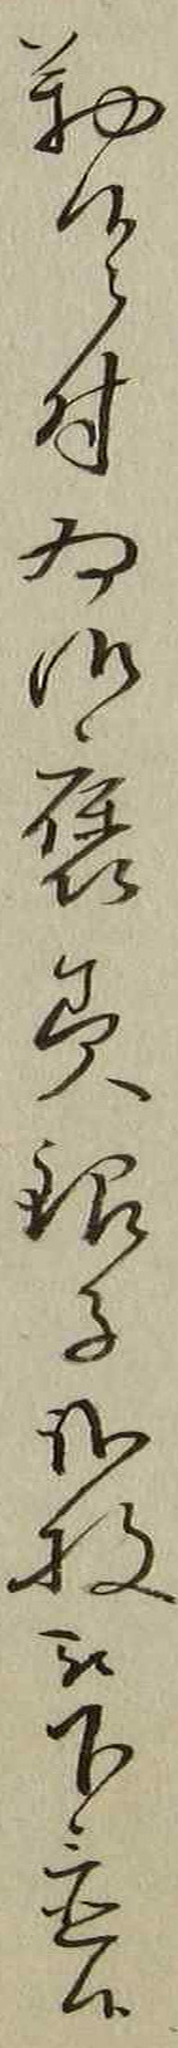勤候ニ付為御褒美銀子弐枚被下置候
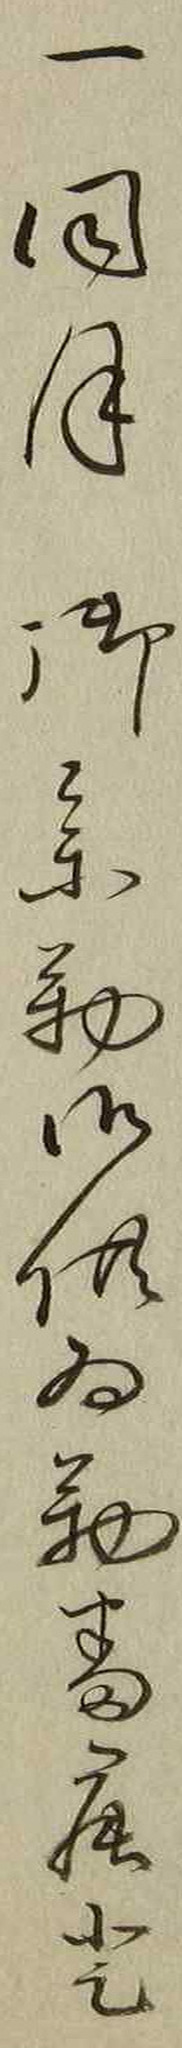一同月御参勤御供為勤番罷登
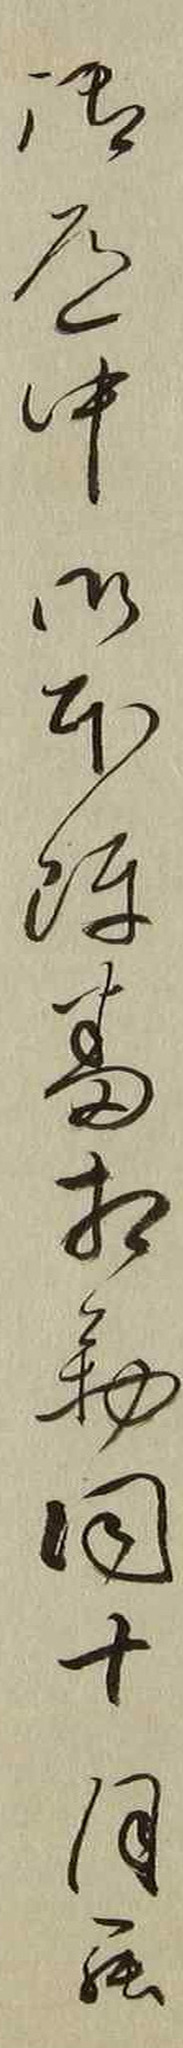御道中御本陣番相勤同十月罷
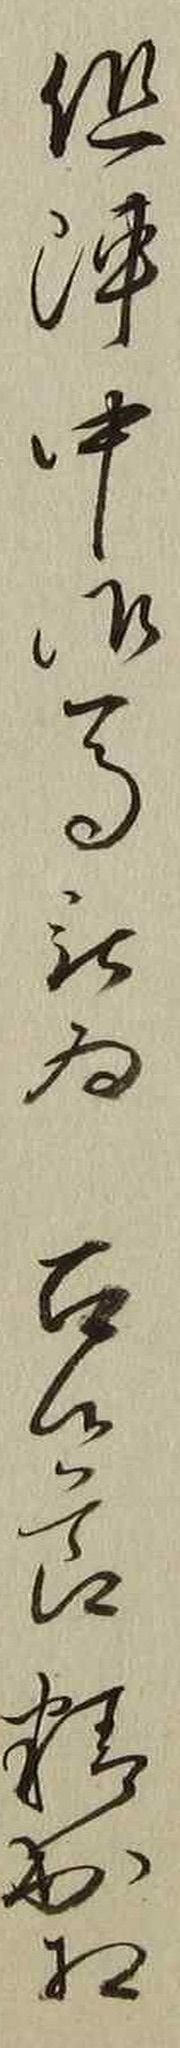但陣中御馬被為召候節精出相
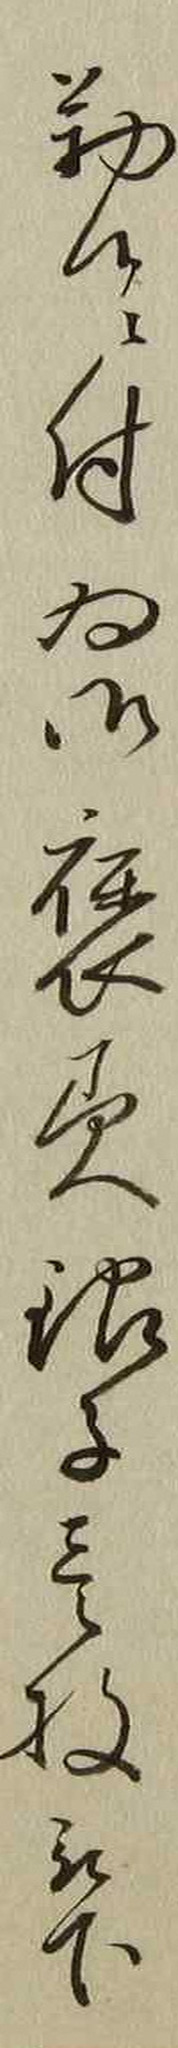勤候ニ付為御褒美銀子壱枚被下
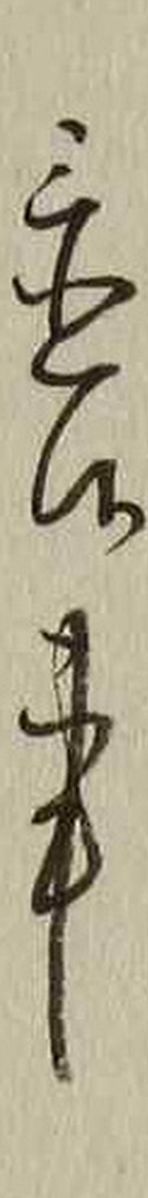置候事
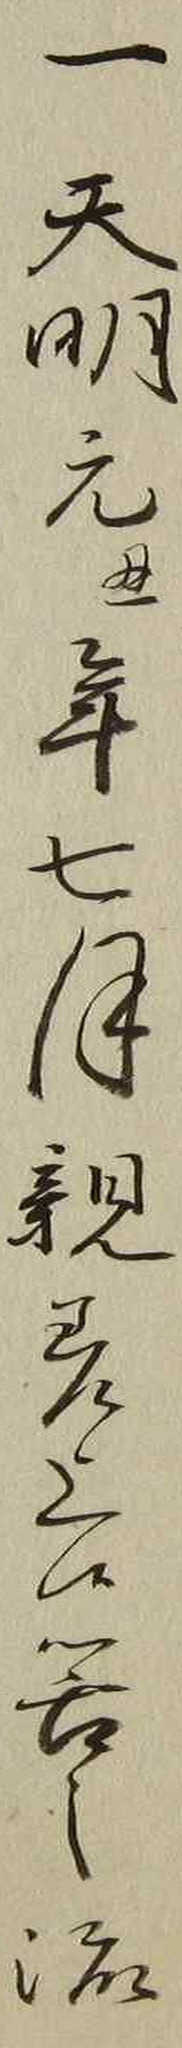一天明元丑年七月親差上候筈之流
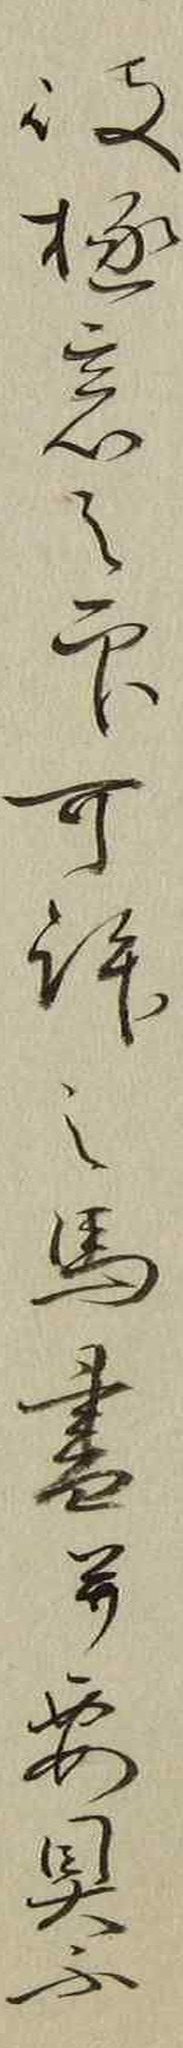岐極意之印可許之馬書幷要具不
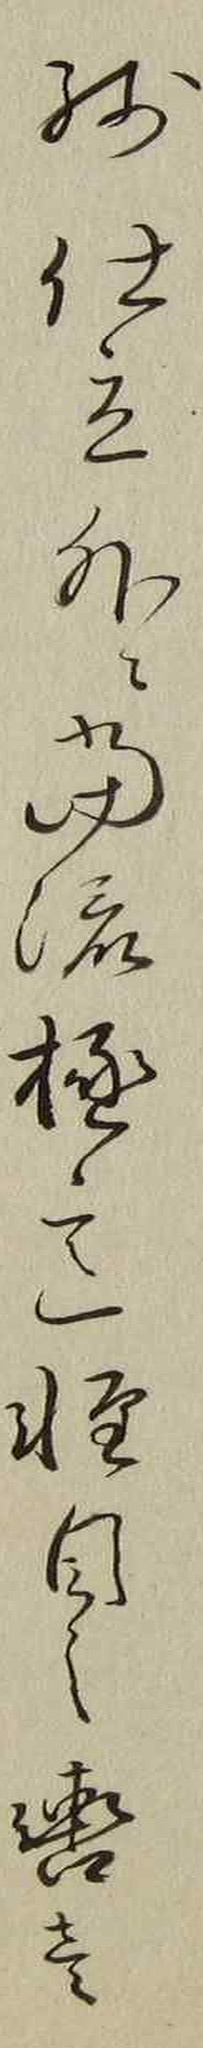残仕立外ニ当流極意軽目之轡壱
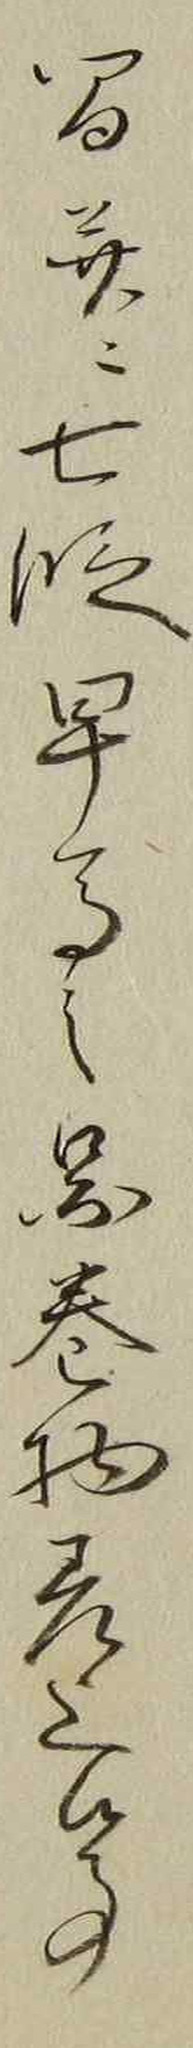間幷ニ七段早馬之図巻物差上候事
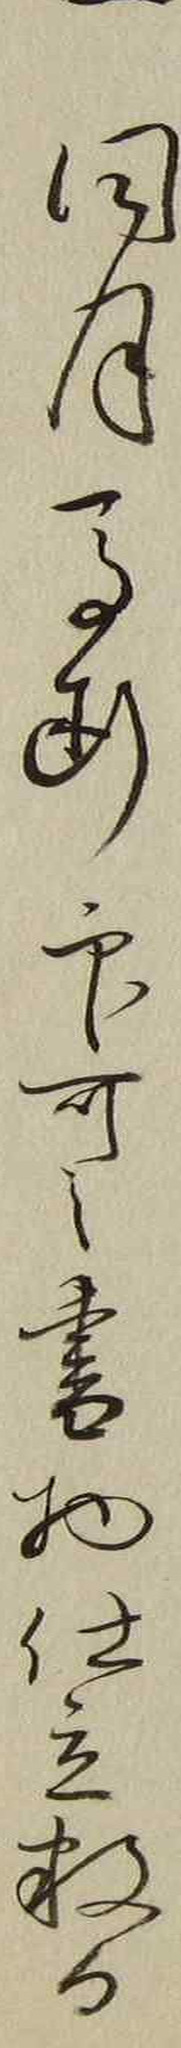一同月馬術印可之書物仕立数日
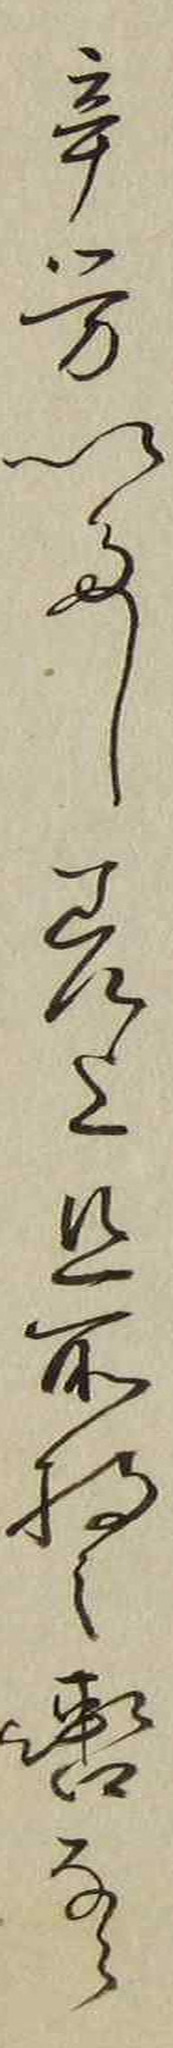辛労いたし差上且所持之轡なら

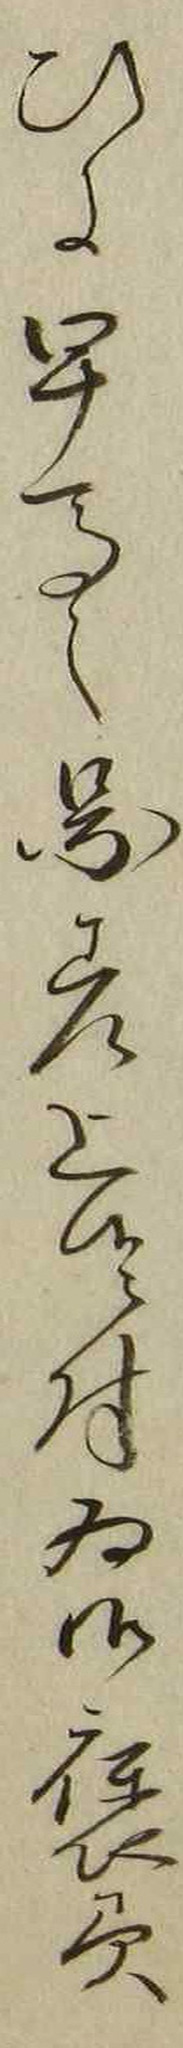ひに早馬之図差上候ニ付為御褒美
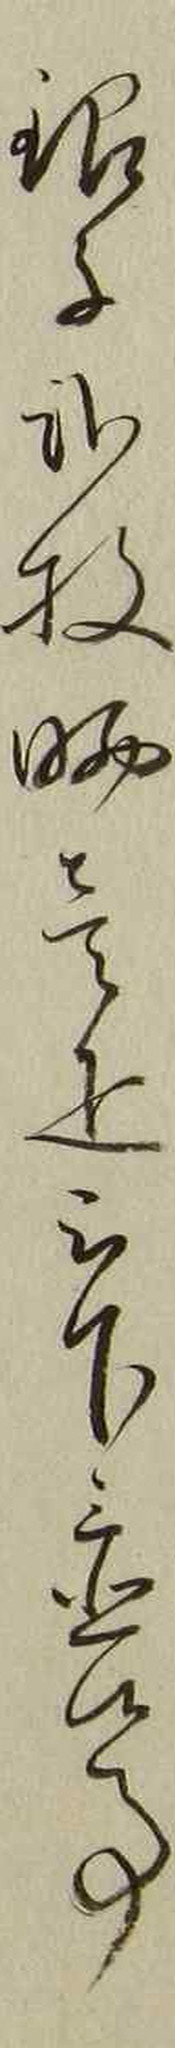銀子弐枚晒壱疋被下置候事
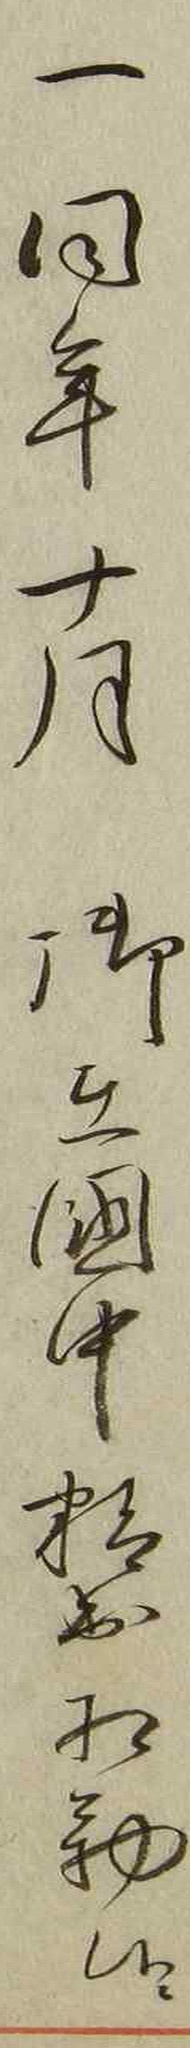一同年十月御在国中精出相勤候ニ
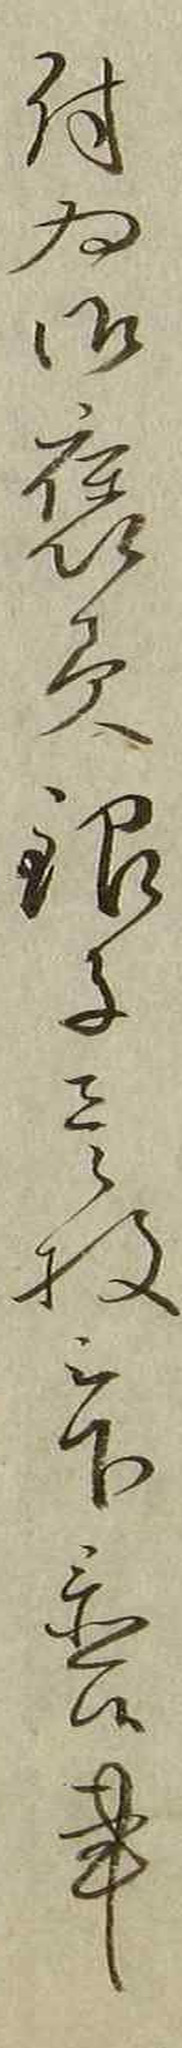付為御褒美銀子壱枚被下置候事
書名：諸士系譜　巻之3　い之部3
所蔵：会津若松市立会津図書館
